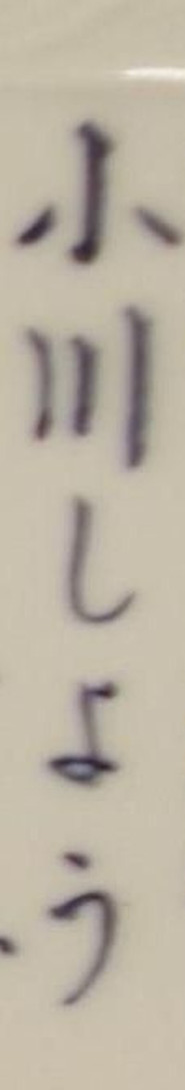小川しよう
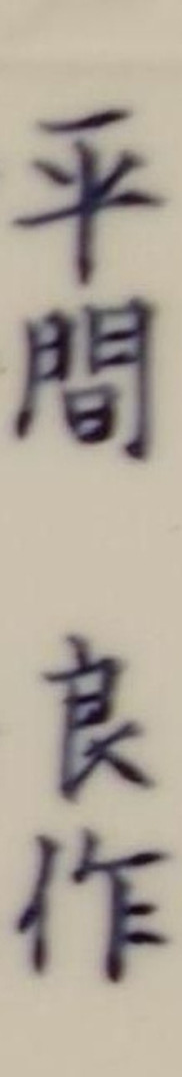平間良作
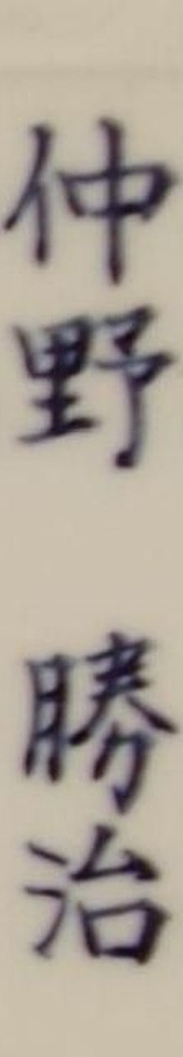仲野勝治
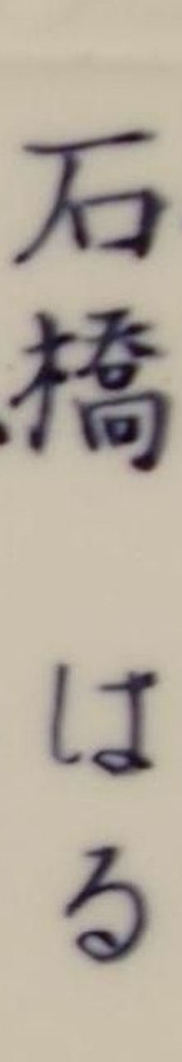石橋はる
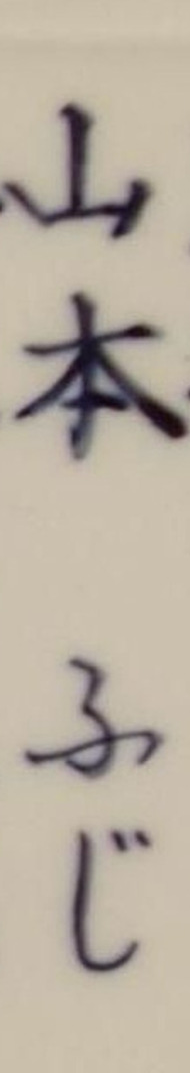山本ふじ
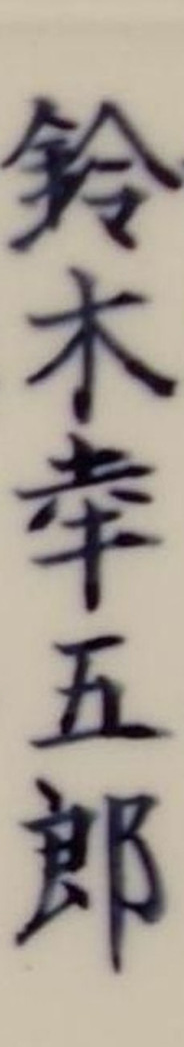鈴木幸五郎
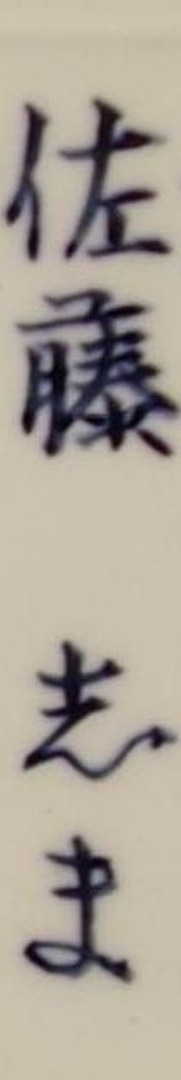佐藤しま
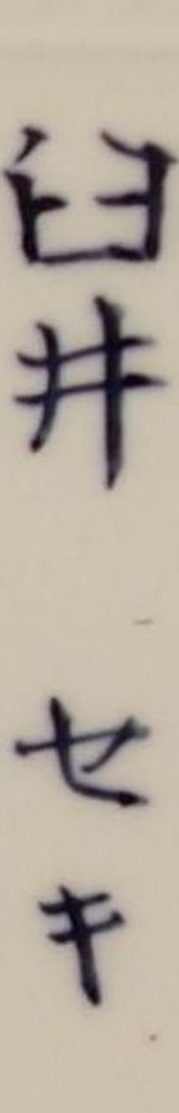臼井セキ
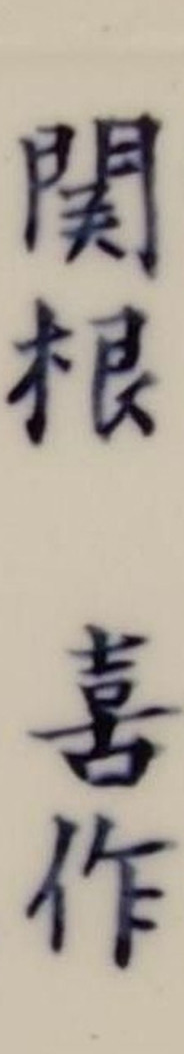関根喜作
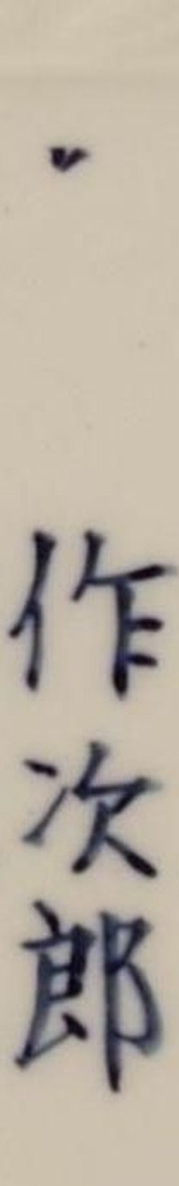作次郎
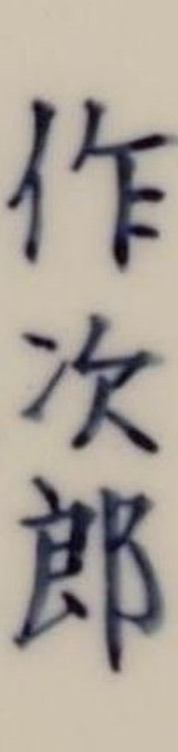作次郎
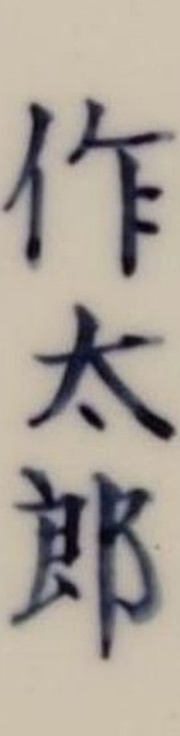作太郎
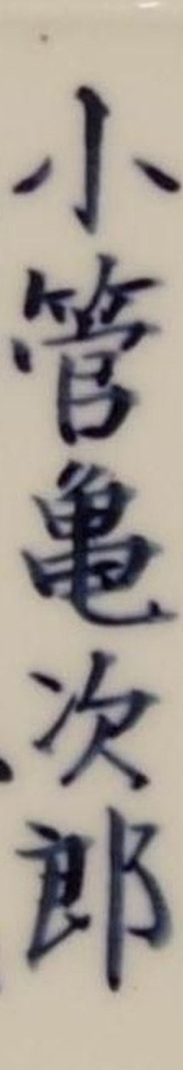小管亀次郎
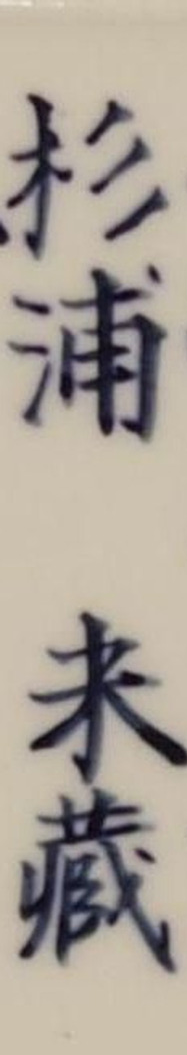杉浦米蔵
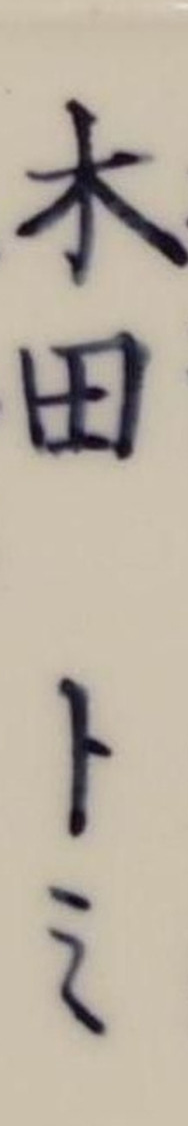木田トミ
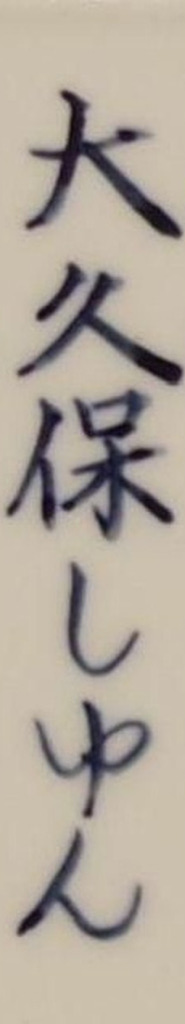大久保しゆん
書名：M~S
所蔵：高野山金剛峯寺
